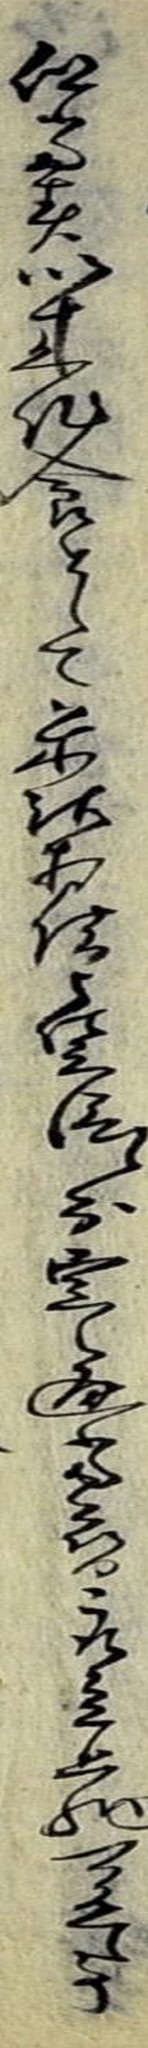但当春以来作食として米銀拝借被貸渡候分定之通当暮取立上納可有之事
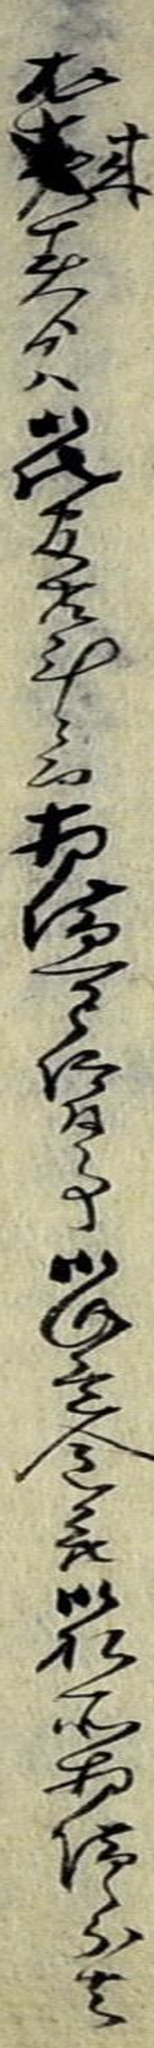尤来春ゟは御代官共斗に而拝借可被仰付事御趣意金并御札所拝借分は
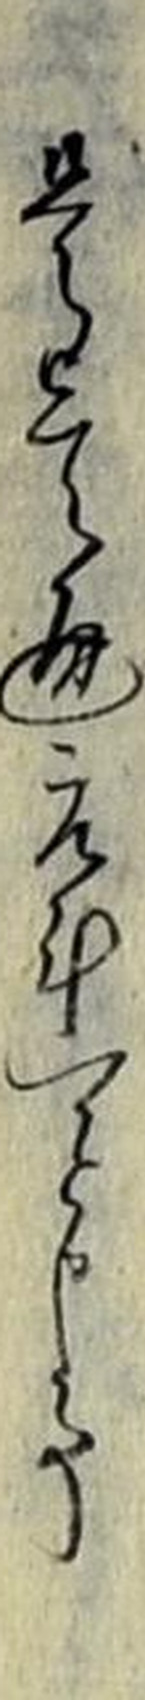是迄之通取斗可被申事
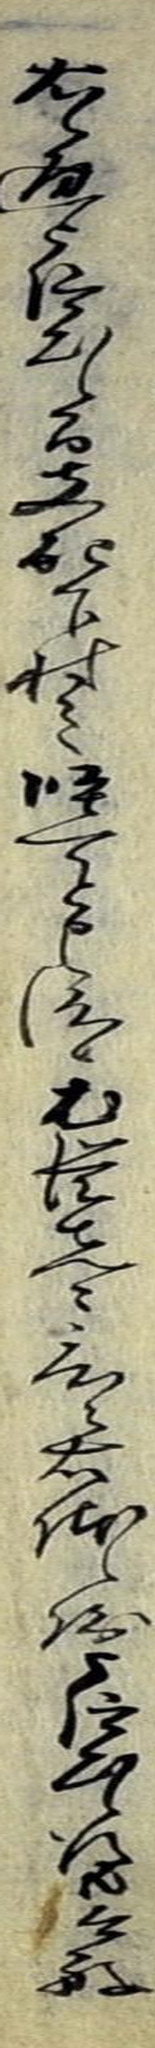右之通被仰出候間支配下村々へ堅可被申渡候尤従先々度に右体之儀被仰出候得共今般
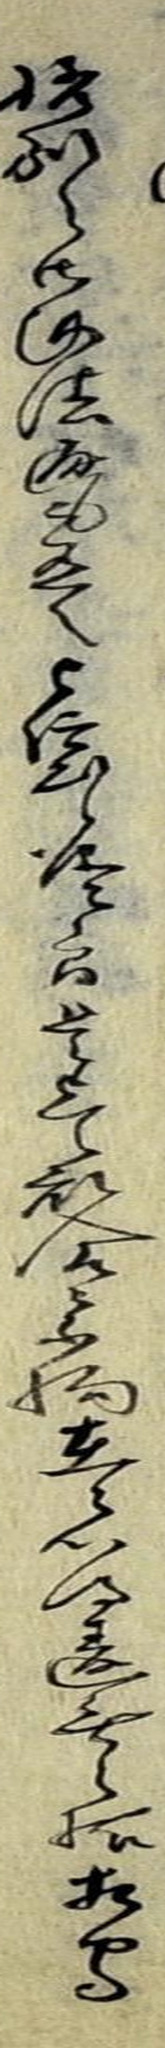格別之御趣法通も有之被仰出候儀に候間是迄之形合に不拘在々心得違無之様相守
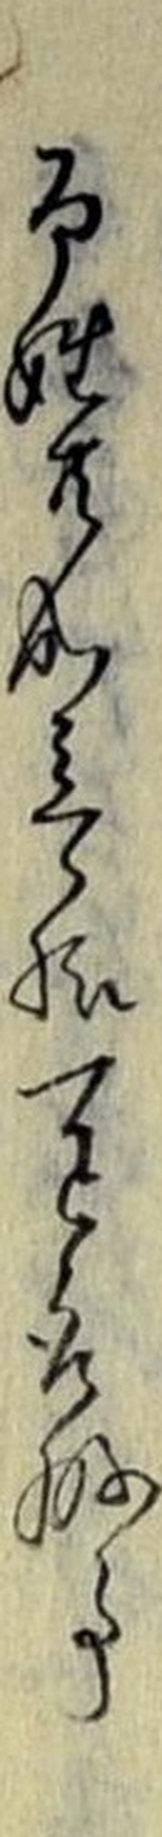百姓共成立候様可被取扱事
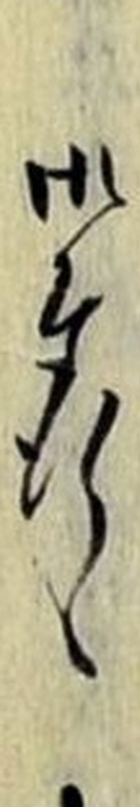御奉行へ
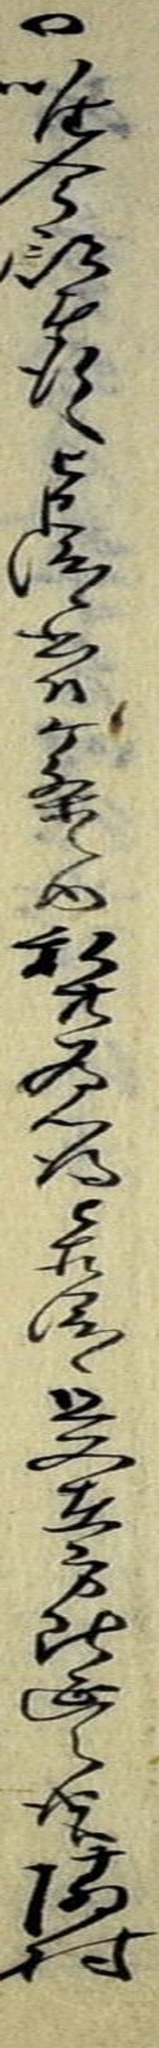〇唯今郡奉行へ被申渡候書付ケ条之内私共為心得被相渡候且又在方断延之儀は隣村
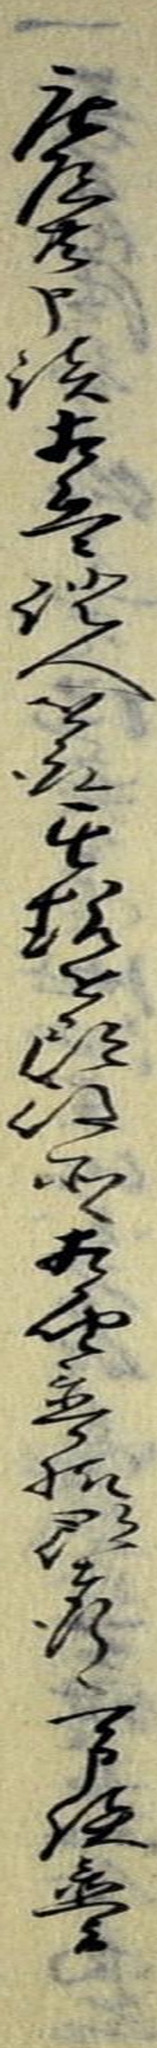庄屋共申談相互に証人を取其趣を郡役所へ相届置候様郡奉行へ可申談置旨
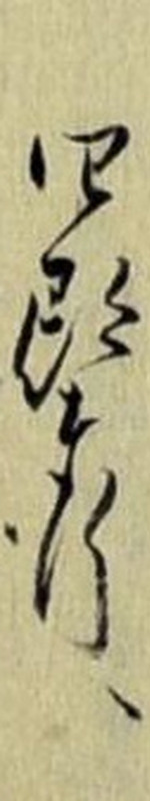四郡奉行へ
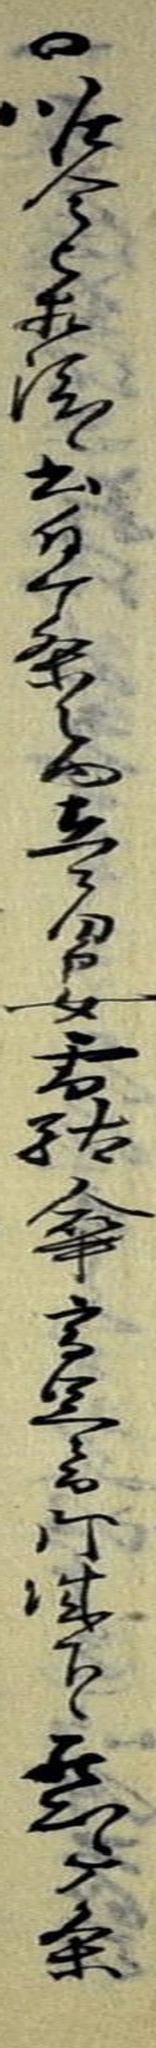〇唯今被相渡候書付ケ条之内在々男女雪駄傘高足に而御城下へ罷出候ケ条
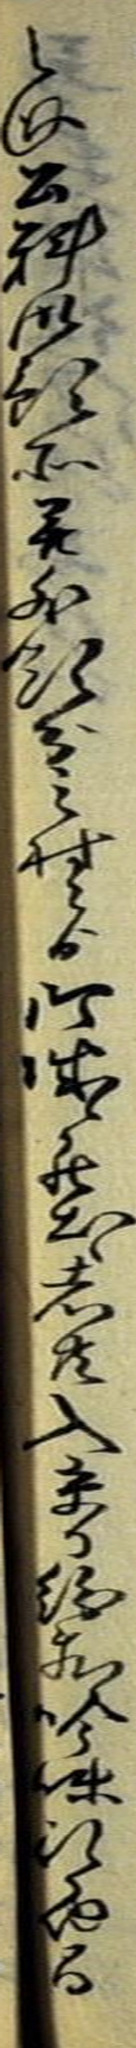之趣公料御預所并外領分之村々ゟ御城へ罷出候者共入交り紛敷吟味行届間
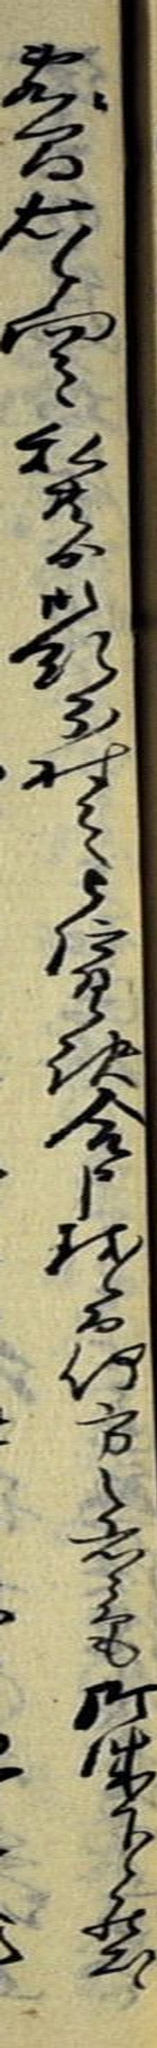敷間右之向々へ私共ゟ御領分村々へ被仰付候訳合申越候而何方之者に而も御城下へ罷出候
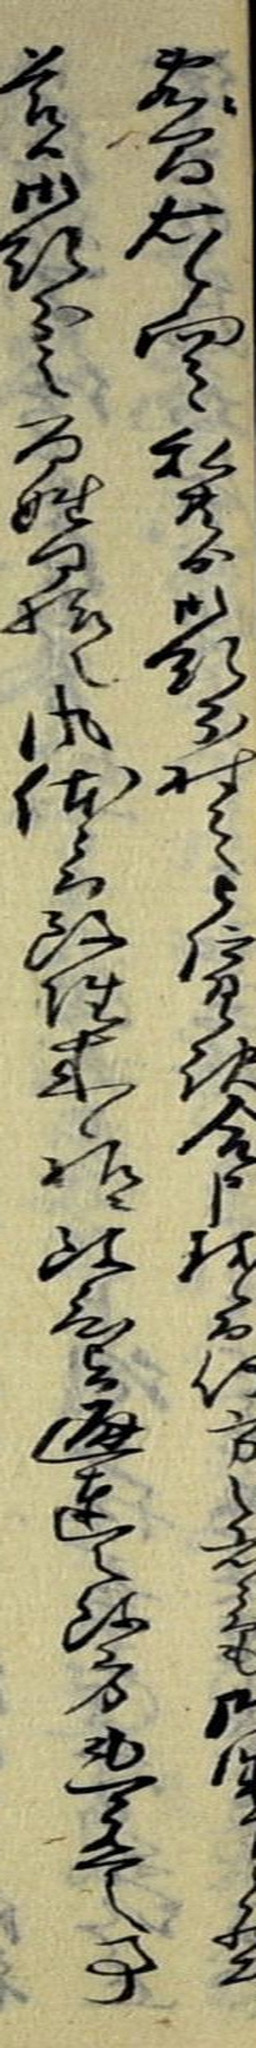節は御領分之百姓同様之風体に而致往来候様に致度旨通達之致方も可有之
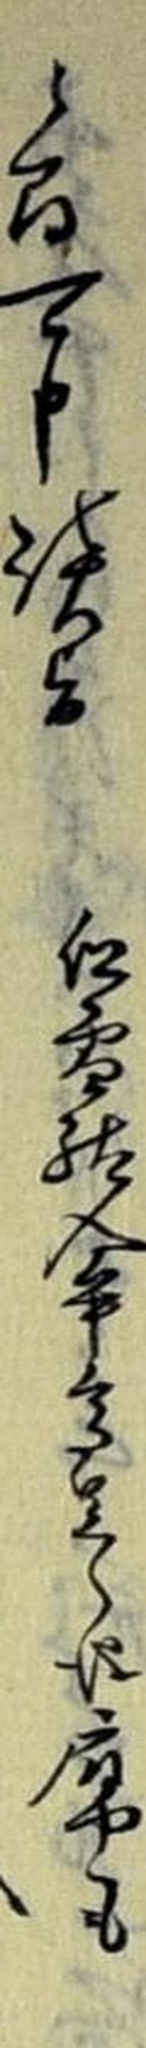候間可申談旨但雪駄傘高足之儀府中へも
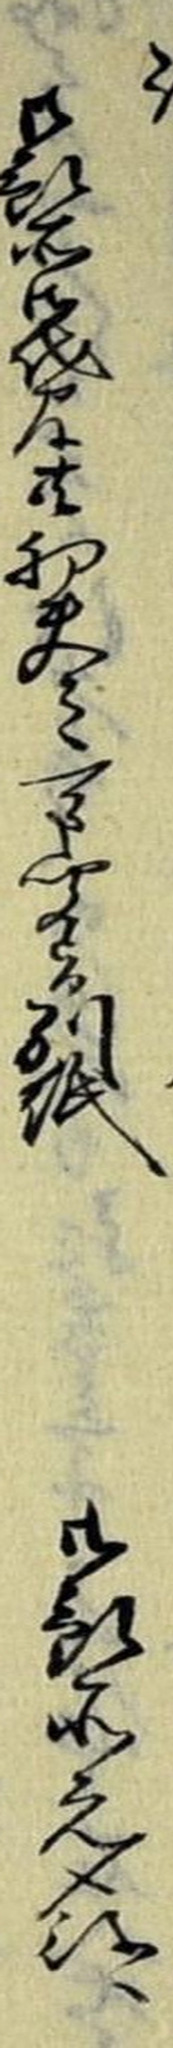御預所御代官共初夫々へ可申聞旨別紙御預所元締メ役へ
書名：命令之部 二
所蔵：福井県文書館 Fukui Prefectural Archives
